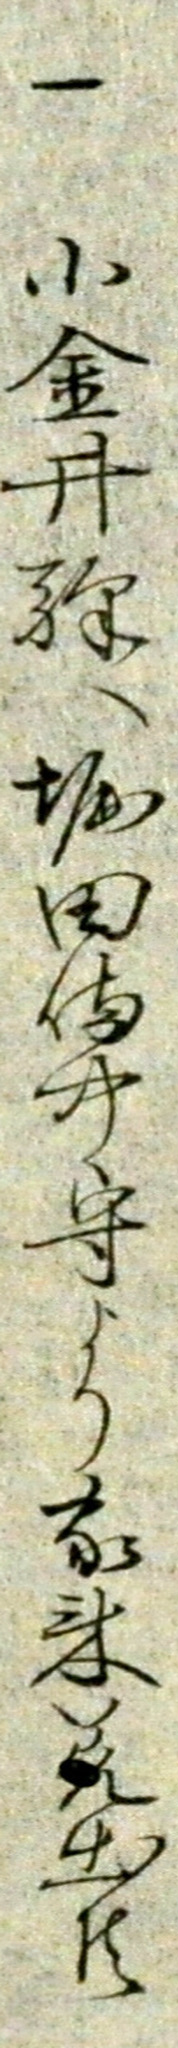一小金井駅へ堀田備中守より家来差出候
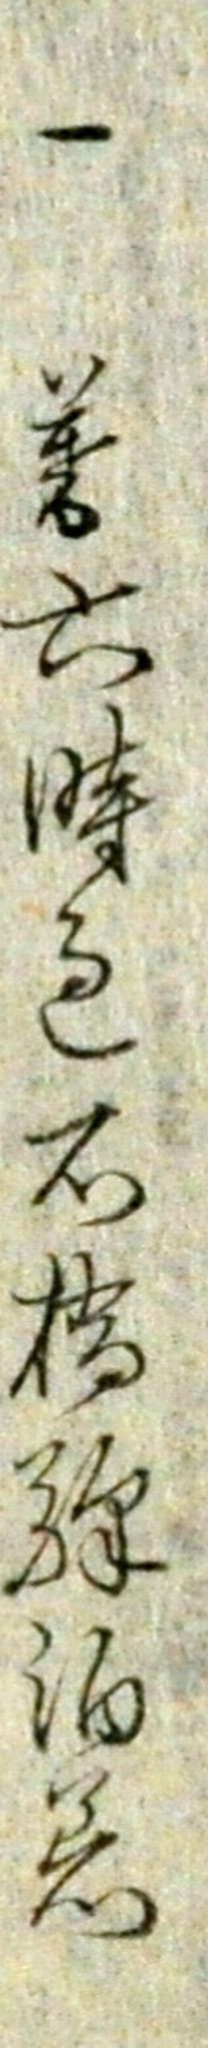一暮六時過石橋駅泊着
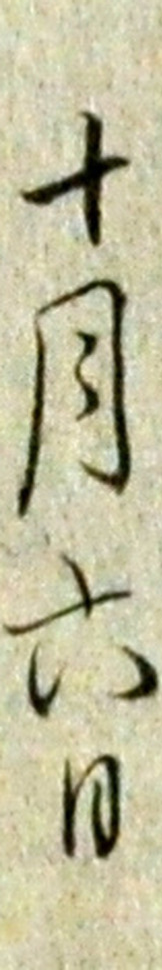十月六日
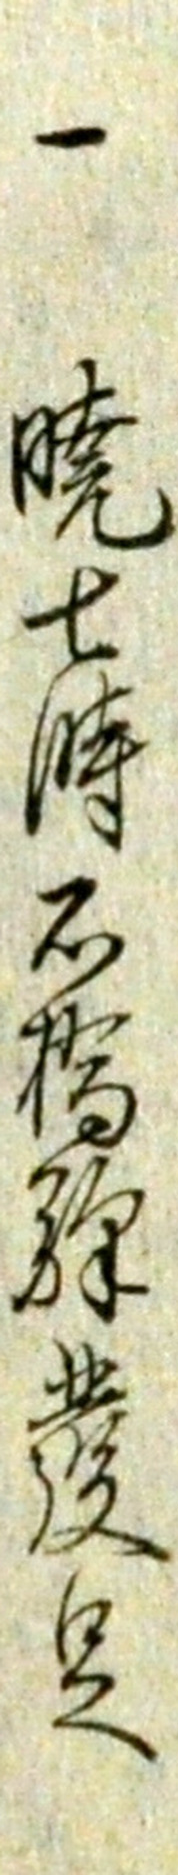一暁七時石橋駅発足
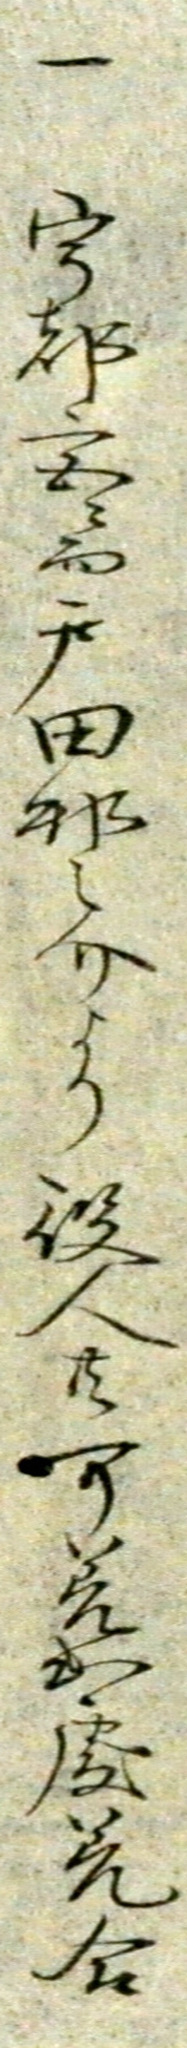一宇都宮ニ而戸田邦之介より役人共可差出処差合
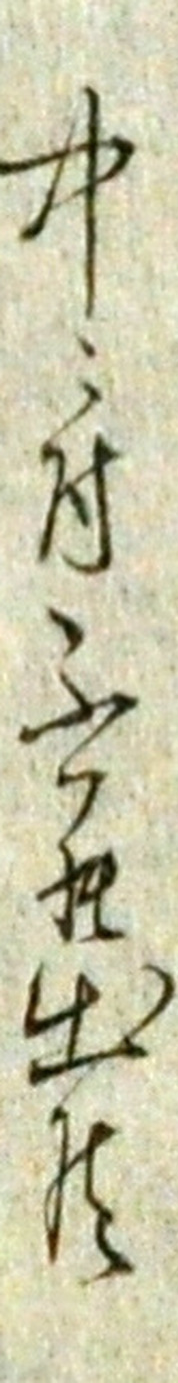中ニ付不罷出候
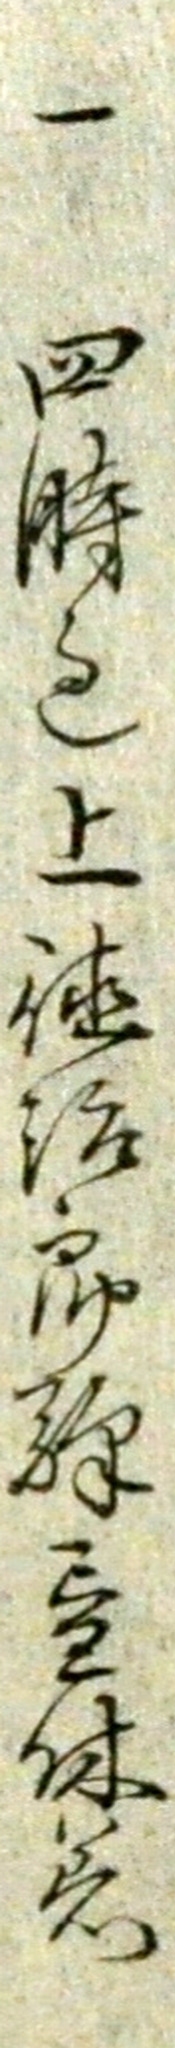一四時過上徳治郎駅昼休着
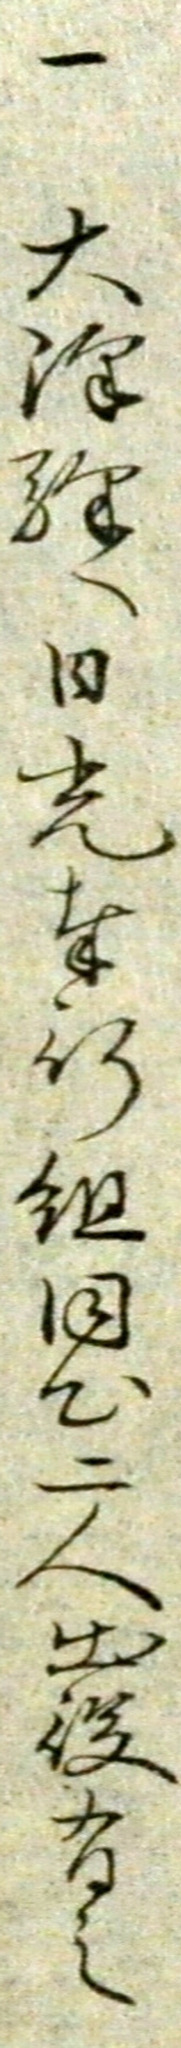一大澤駅へ日光奉行組同心二人出役有之
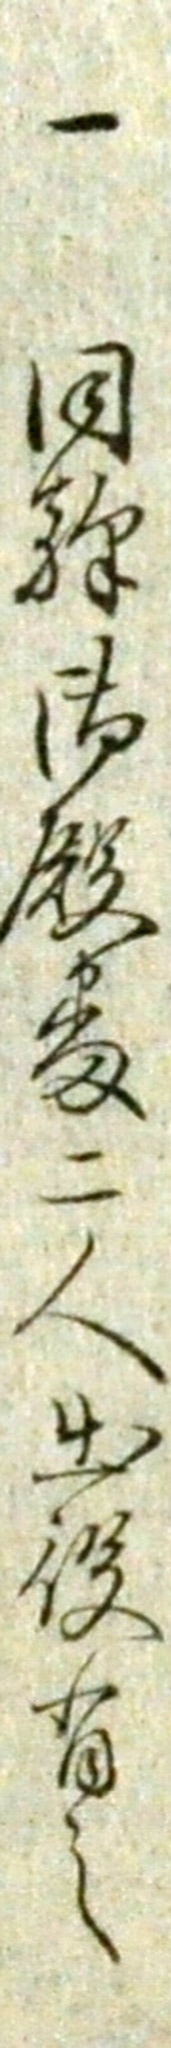一同駅御殿番二人出役有之
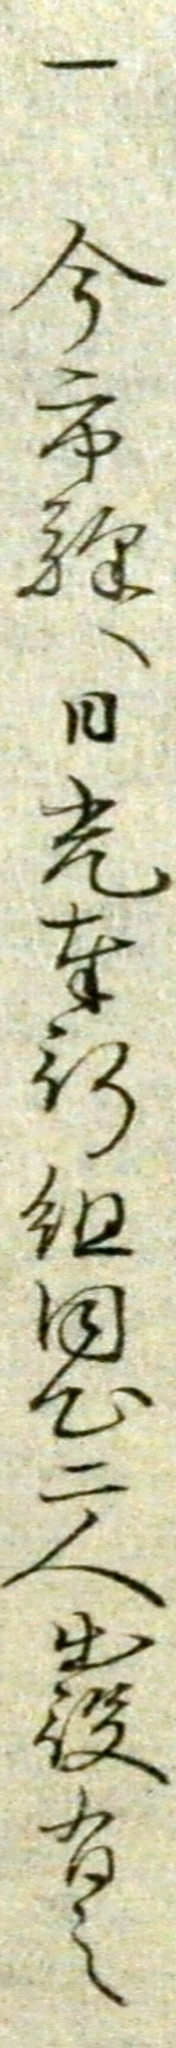一今市駅へ日光奉行組同心二人出役有之
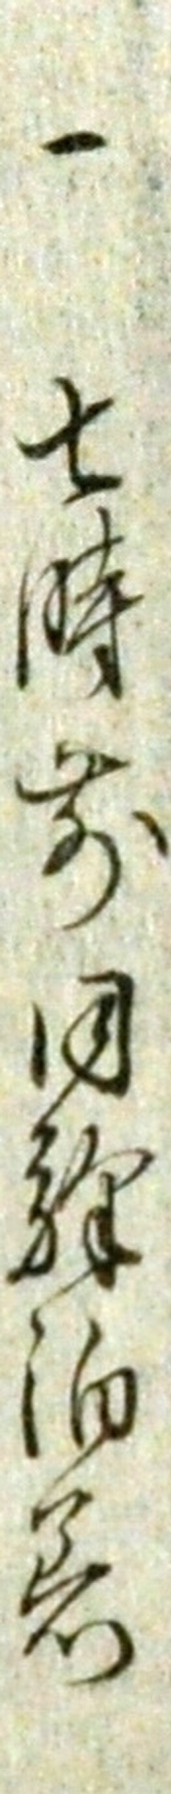一七時前同駅泊着

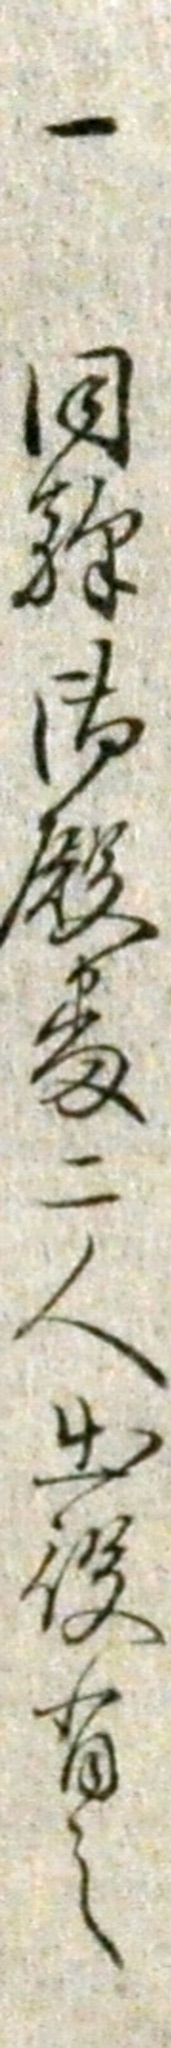一同駅御殿番二人出役有之
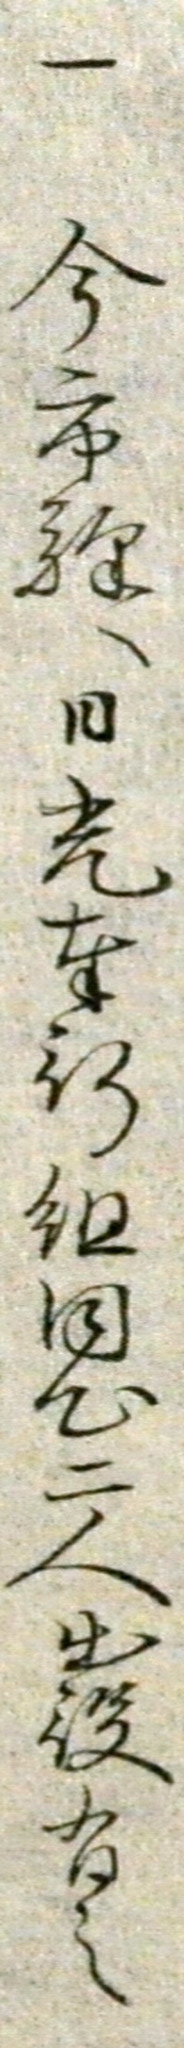一今市駅へ日光奉行組同心二人出役有之
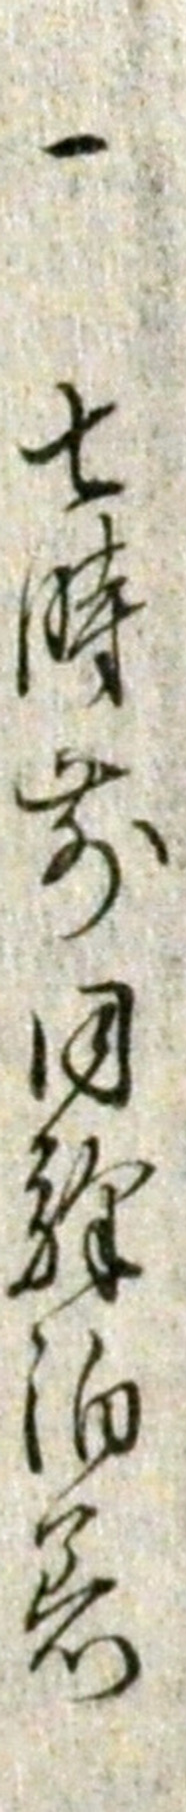一七時前同駅泊着
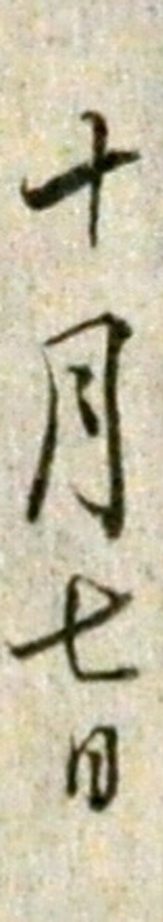十月七日
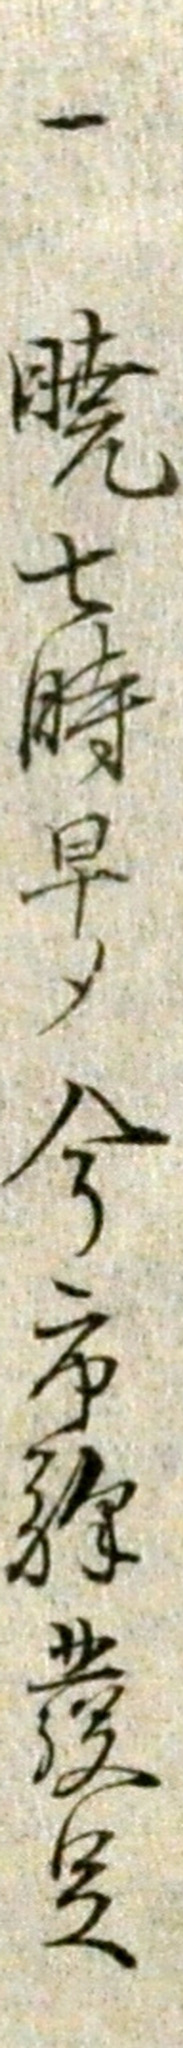一暁七時早メ今市駅発足
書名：日光御名代相勤候節ノ留
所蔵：伊那市立高遠町図書館・合同会社AMANE
